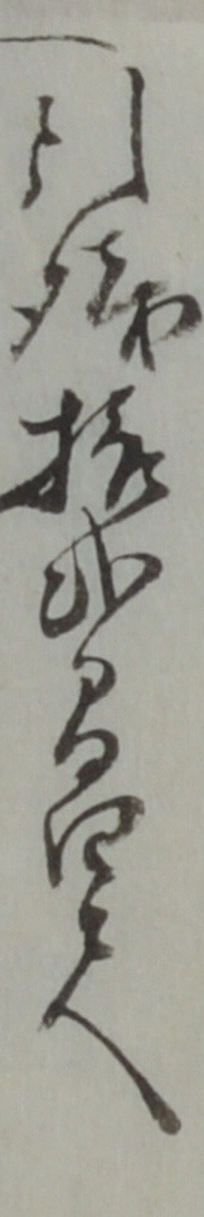引残拾弐間四尺
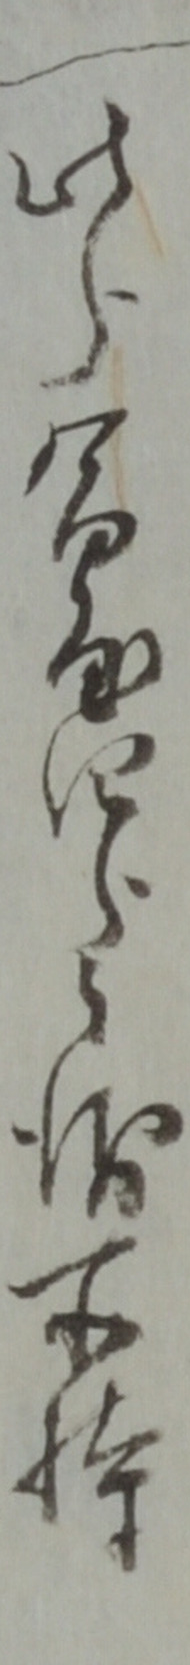此分冨屋四郎兵衛所持

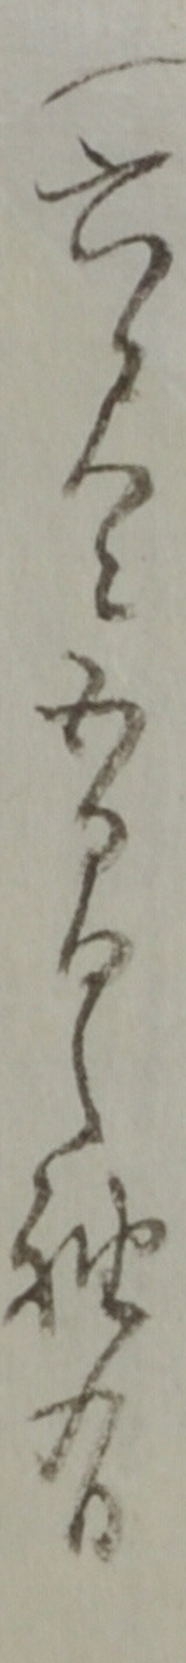六尺と五間之袖有
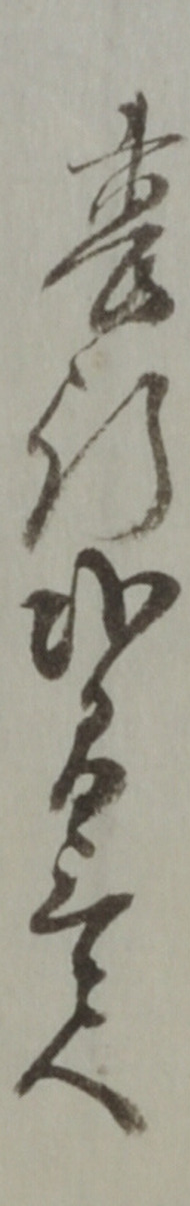裏行弐間三尺
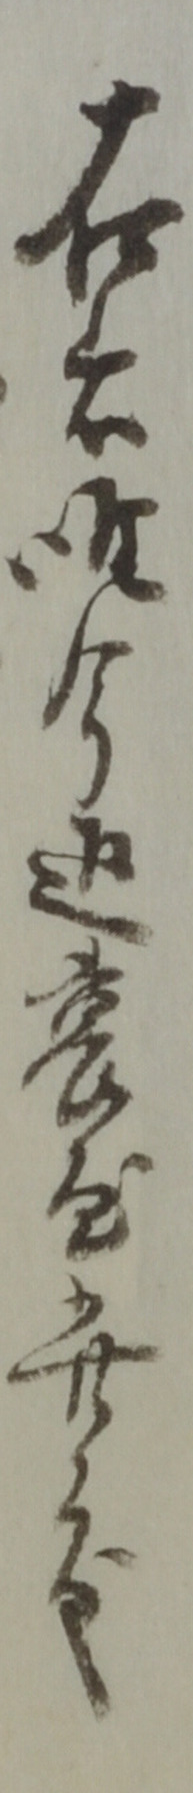右は唯今迄裏屋此度
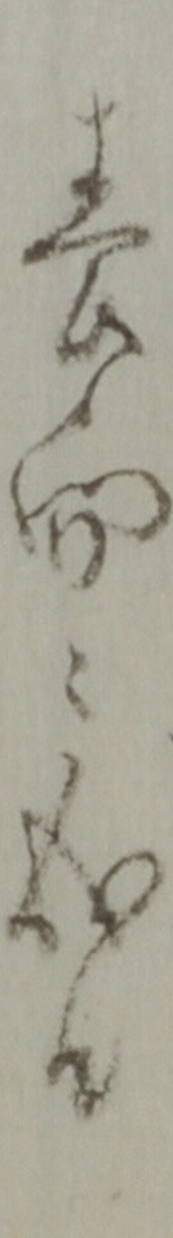表向ニ成候
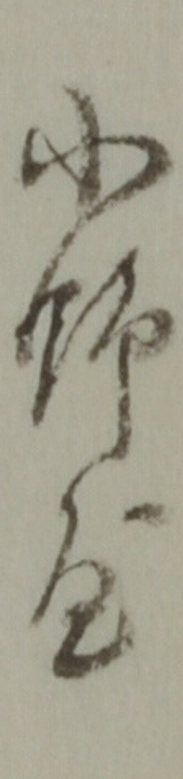小野屋
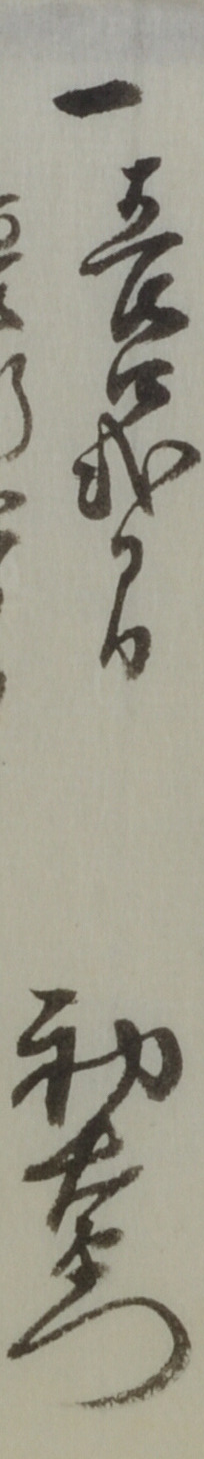一表口弐間初右衛門
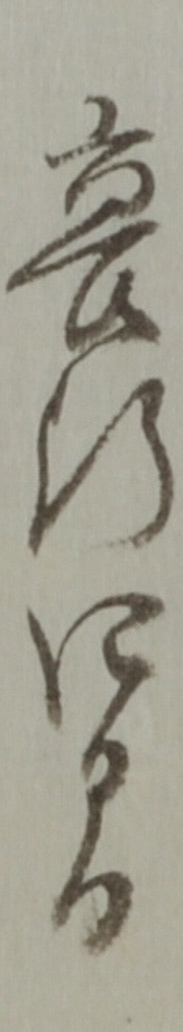裏行四間
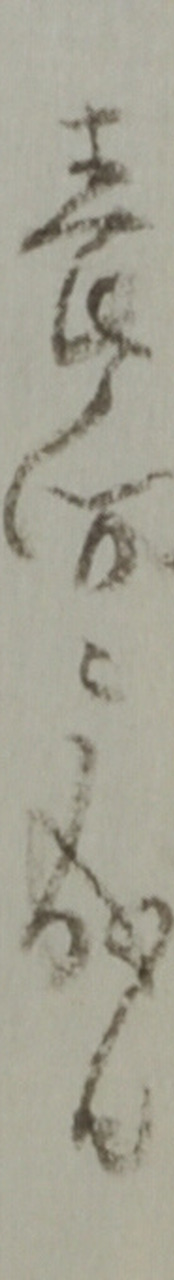表向ニ成候
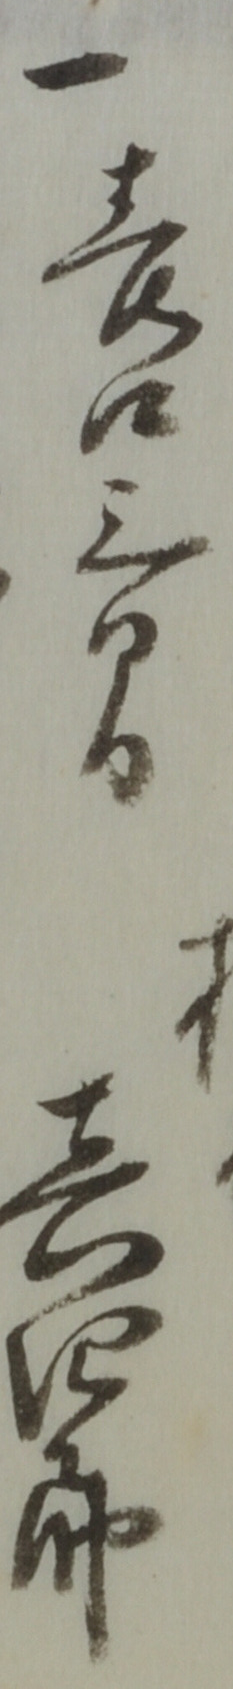一表口三間壱四郎
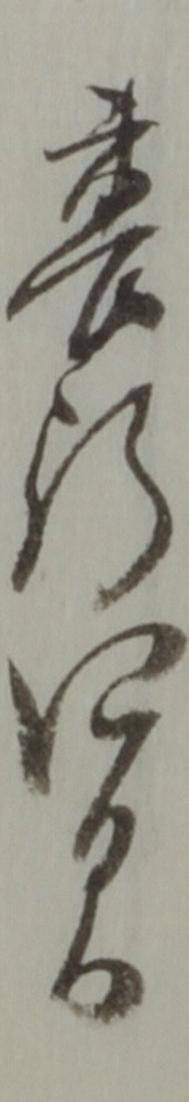裏行四間
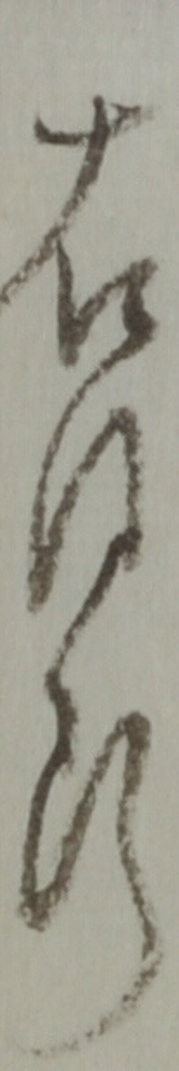右同断

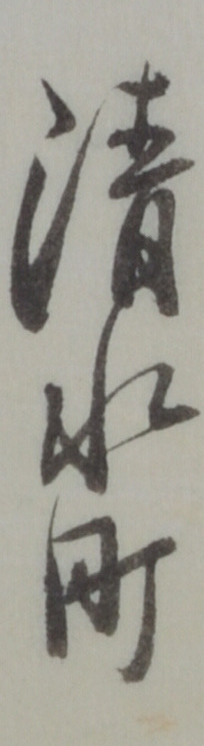清水町
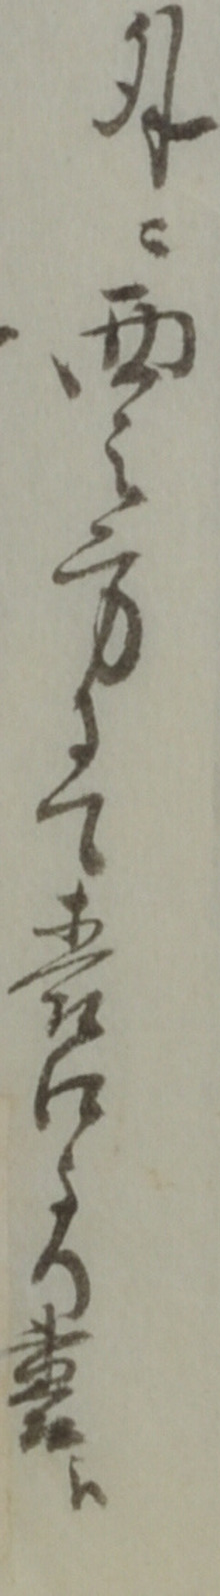外ニ西之方にて表口より裏江
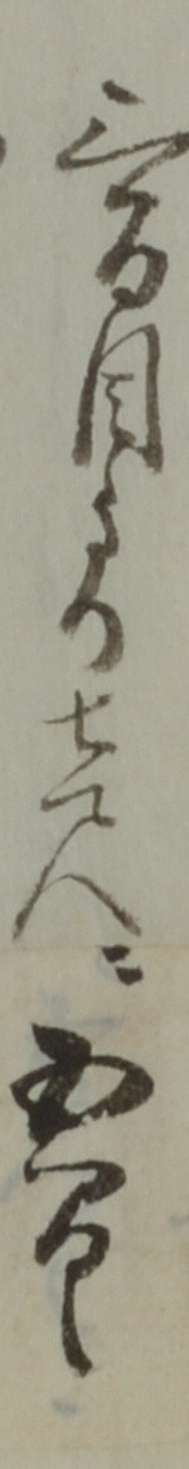三間目より七尺ニ五間之
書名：屋敷表口裏行書上
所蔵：伊那市立高遠町図書館・合同会社AMANE
